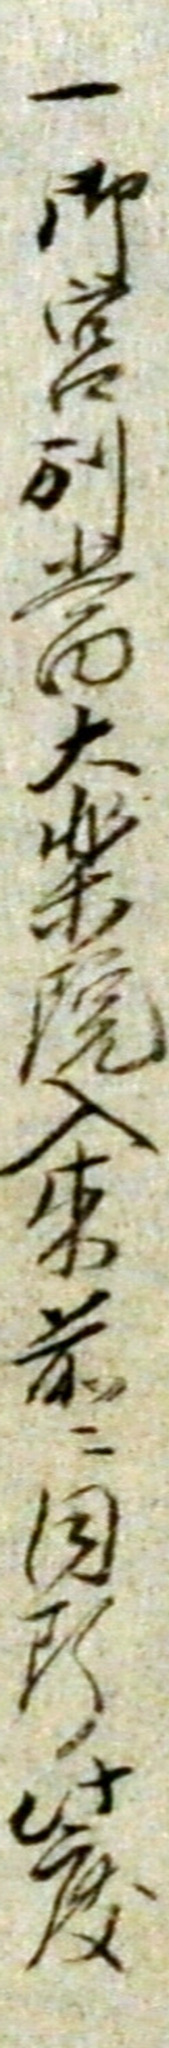一御宮別当大楽院入来前二同断此度
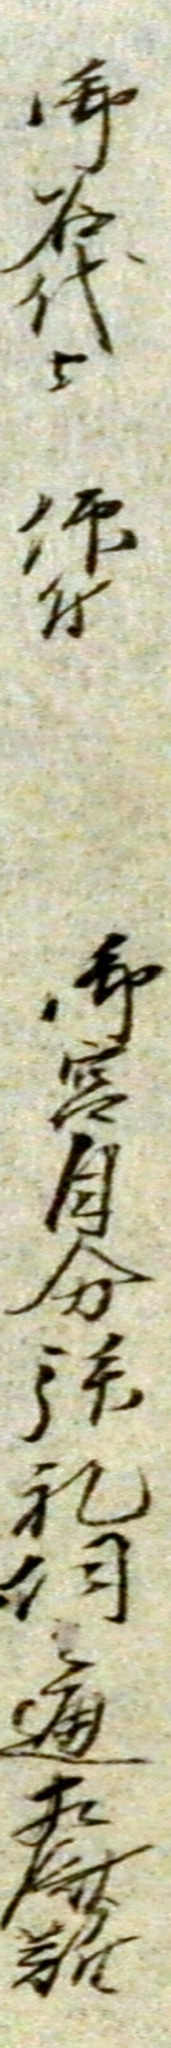御名代ヒ仰付御宮自分拝礼伺之相済難
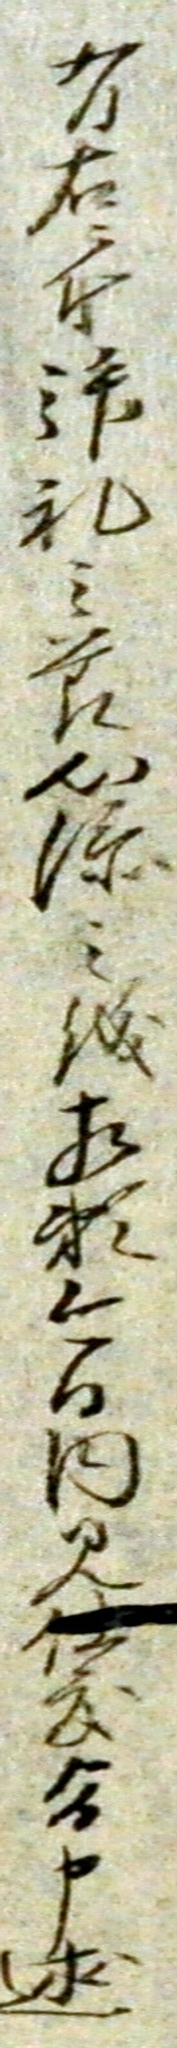有右ニ付拝礼之節心添之儀相頼今日内見仕度旨申述
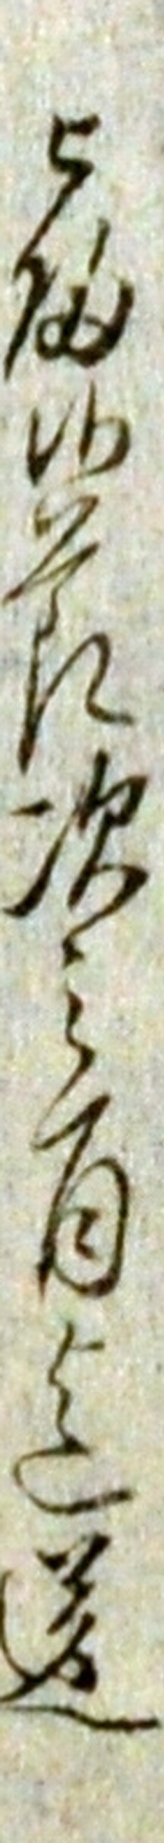ヒ帰候節次之間迄送
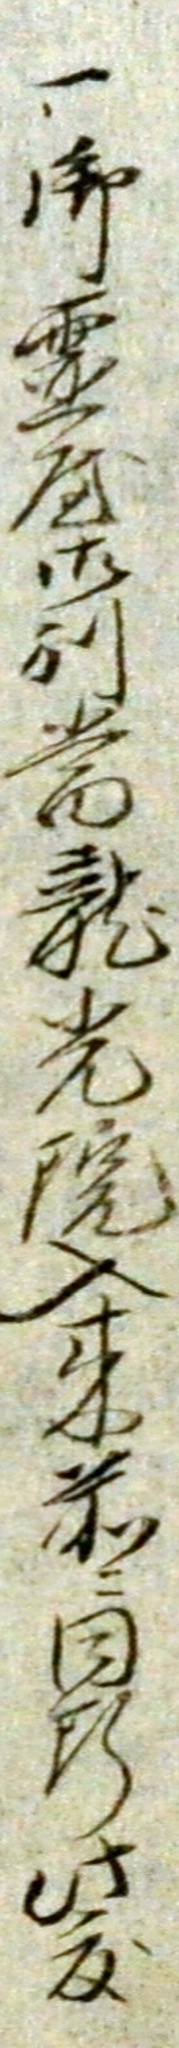一御霊屋御別当龍光院入来前二同断此度
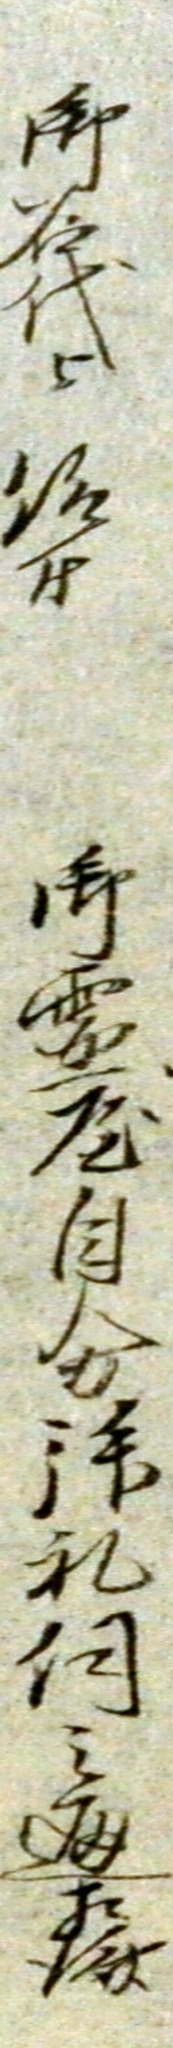御名代ヒ仰付御霊屋自分拝礼伺之通相済
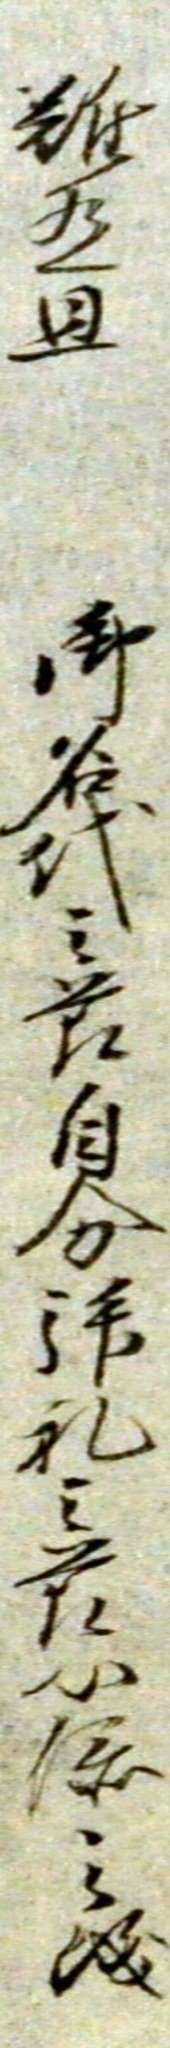難有且御名代之節自分拝礼之節心添之儀
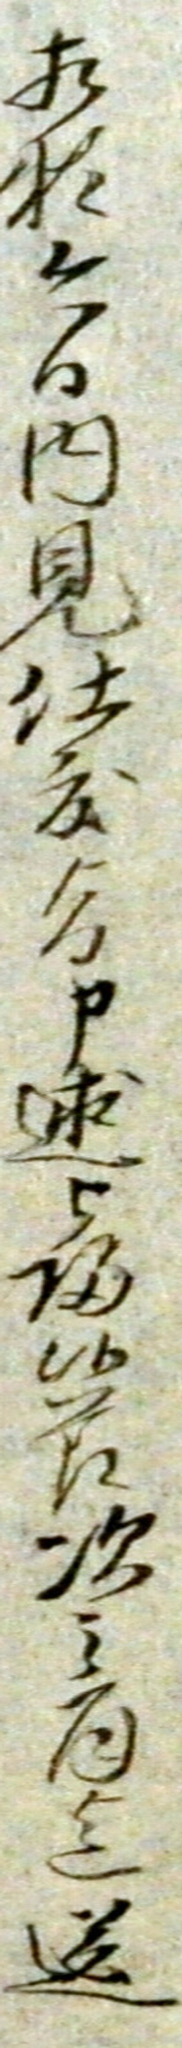相頼今日内見仕度旨申述ヒ帰候節次之間迄送
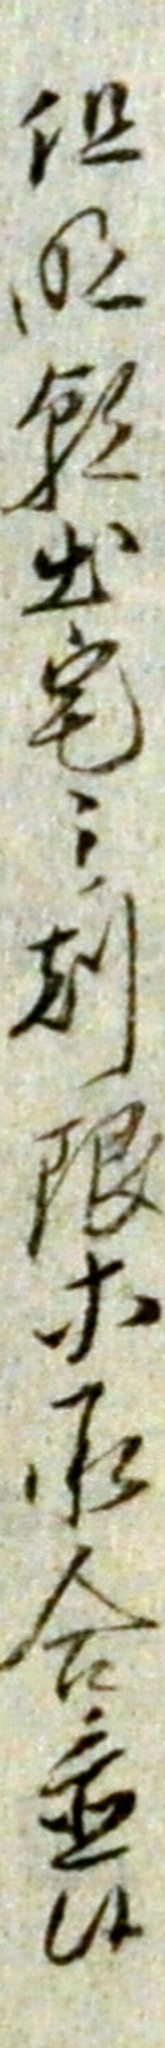但明出宅之刻限抔承合置候
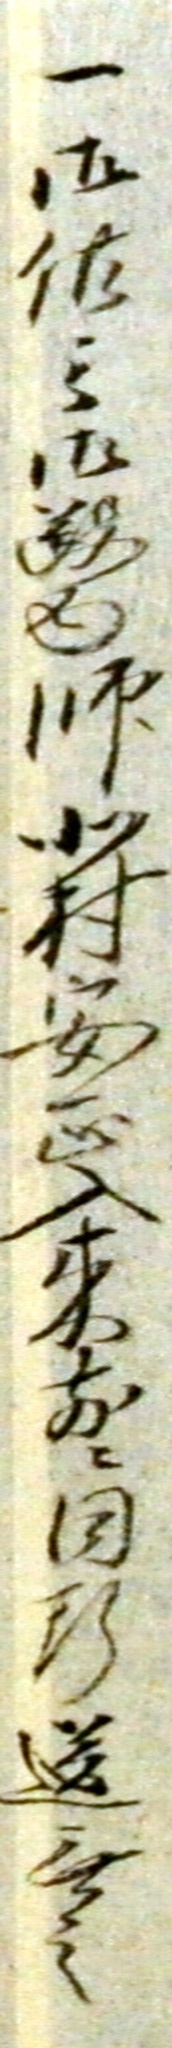一御供御医師北村安正入来前ニ同断送無之
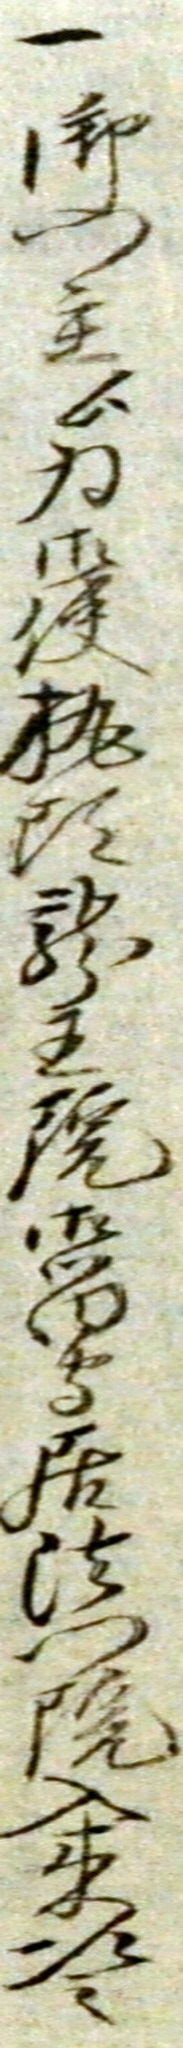一御門主ゟ為御使執頭龍王院御留守居法門院入来次之
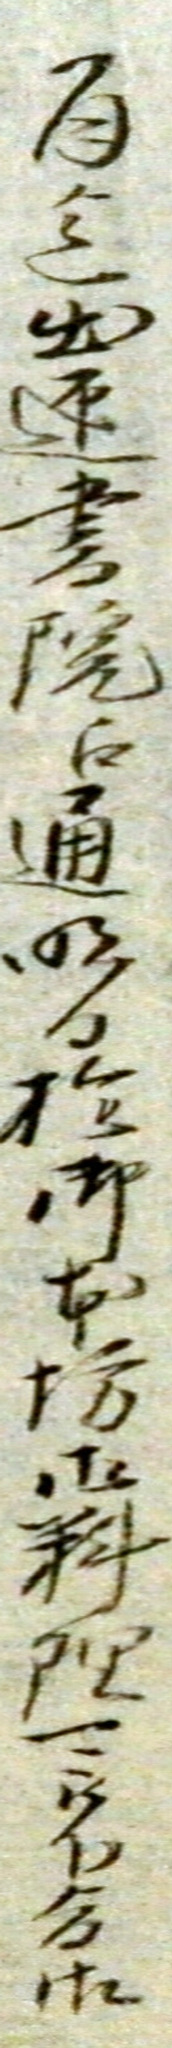間迄出迎書院江通明日於御本坊御料理可被下旨御
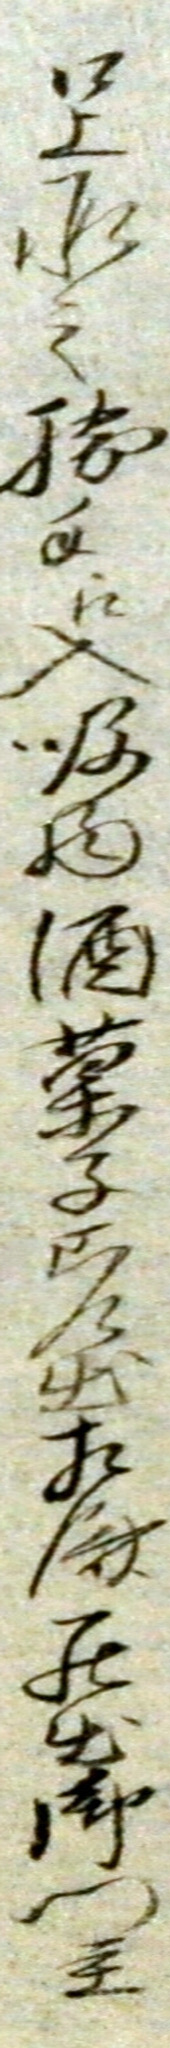口上承之勝手江入吸物酒菓子差出相済罷出御門主
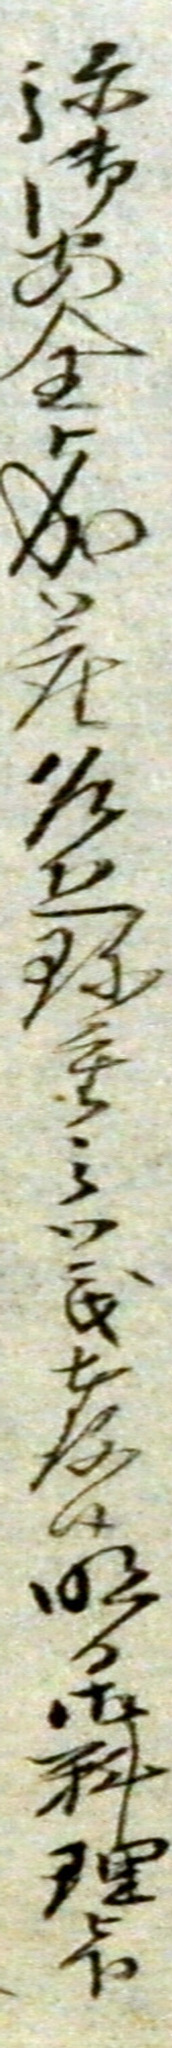弥御安全ヒ成御座乍恐珍重之御義奉存候明日御料理ヒ下
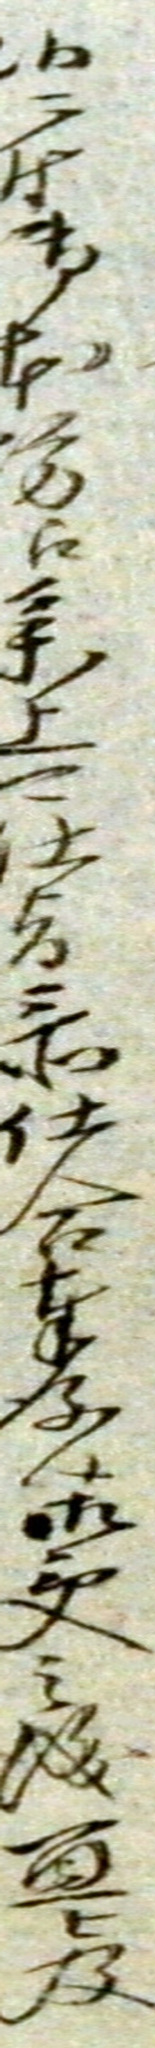候ニ付御本坊江参上可仕旨忝仕合奉存候御受之儀宜ヒ及

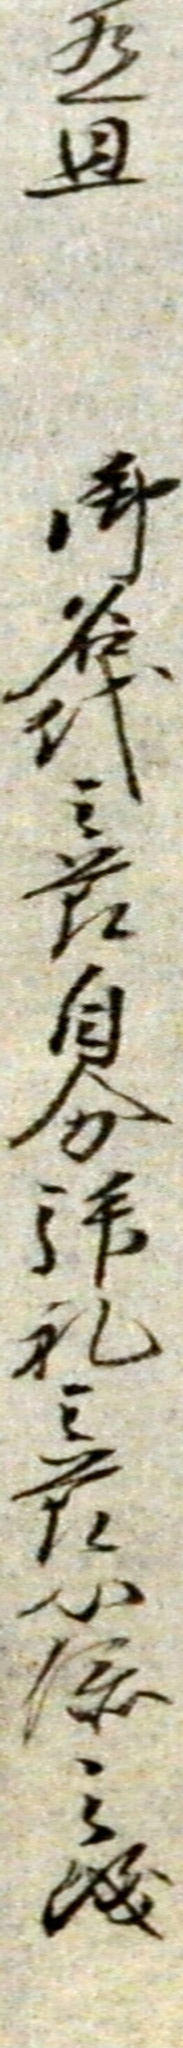難有且御名代之節自分拝礼之節心添之儀
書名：日光御名代相勤候節ノ留
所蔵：伊那市立高遠町図書館・合同会社AMANE
